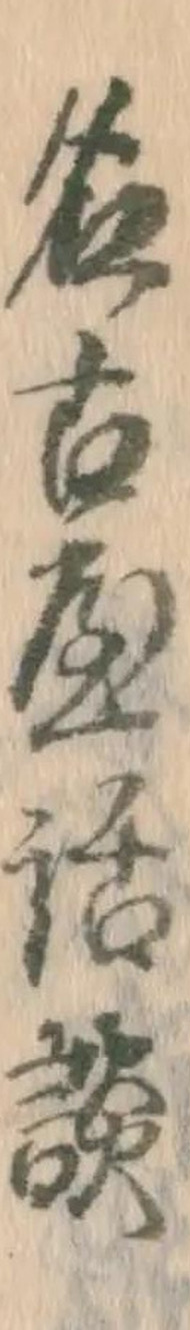名古屋話談
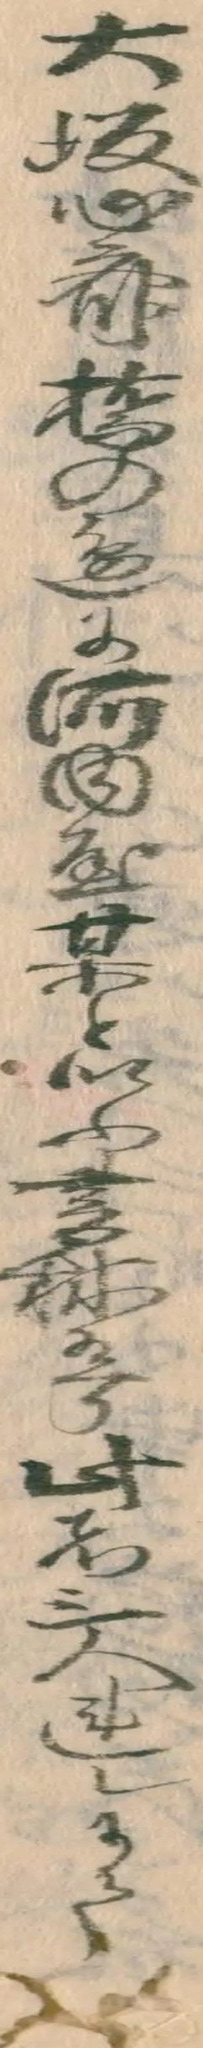大阪心斎橋の辺に河内屋某といふ書林有り此者三人連レにて
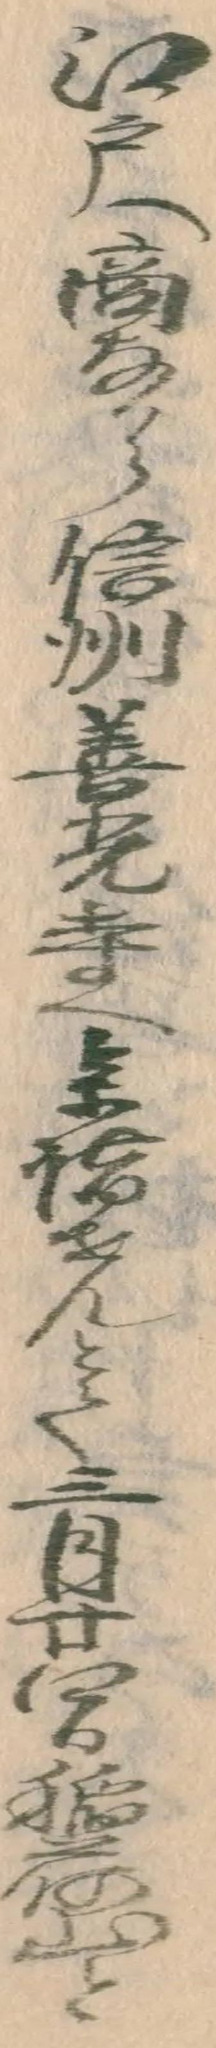江戸へ商なから信州善光寺へ参詣せんとて三月廿四日稲荷山と
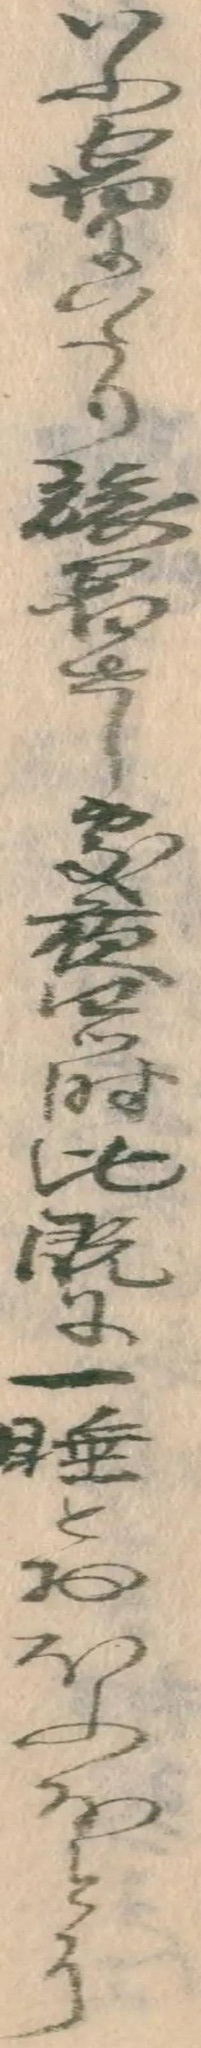いふ宿にいたり旅宿せし処夜四ッ時比既に一睡とおほふほとに
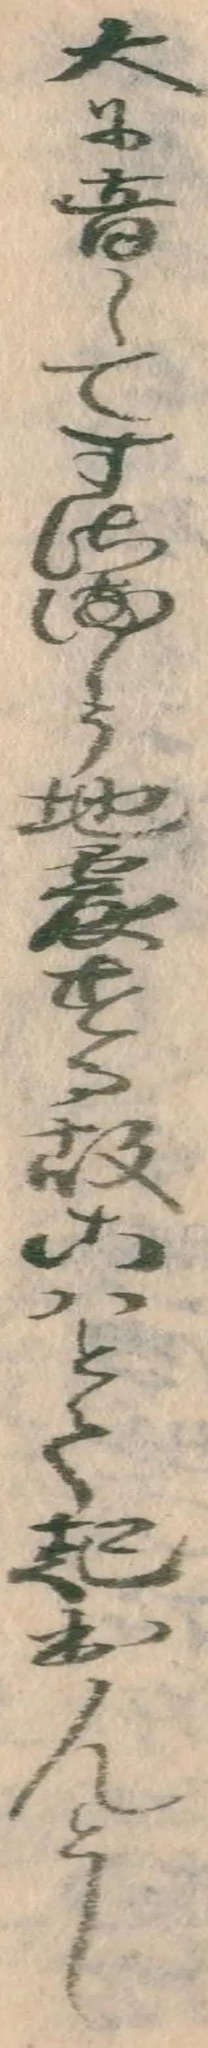大に音してすさましう地震する故こハとて起出んとし
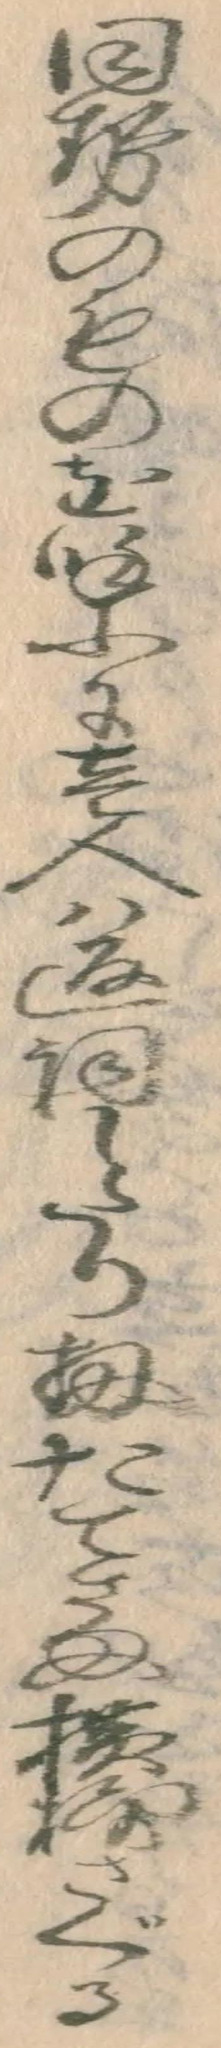同勢のものを呼ふに壱人ハ返詞したり扨たてさま横様さぐる
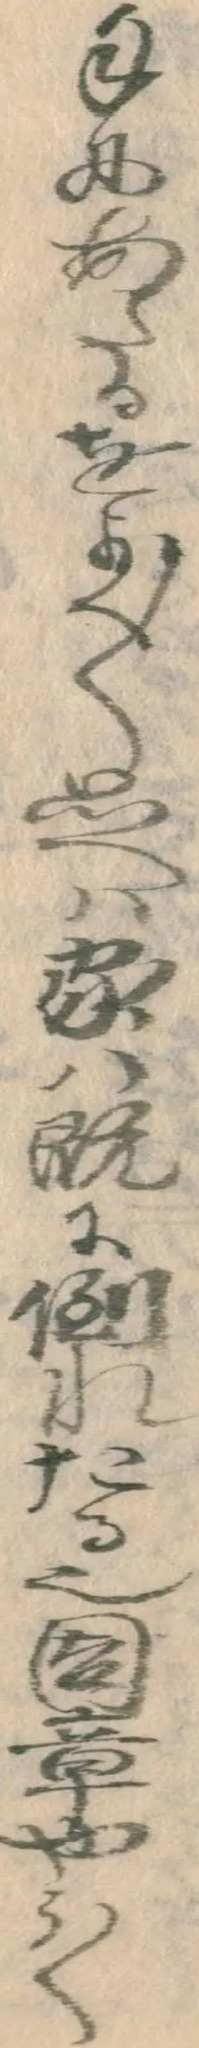手にあたるをよく〳〵思へハ家ハ既に倒れたる也周章やう〳〵
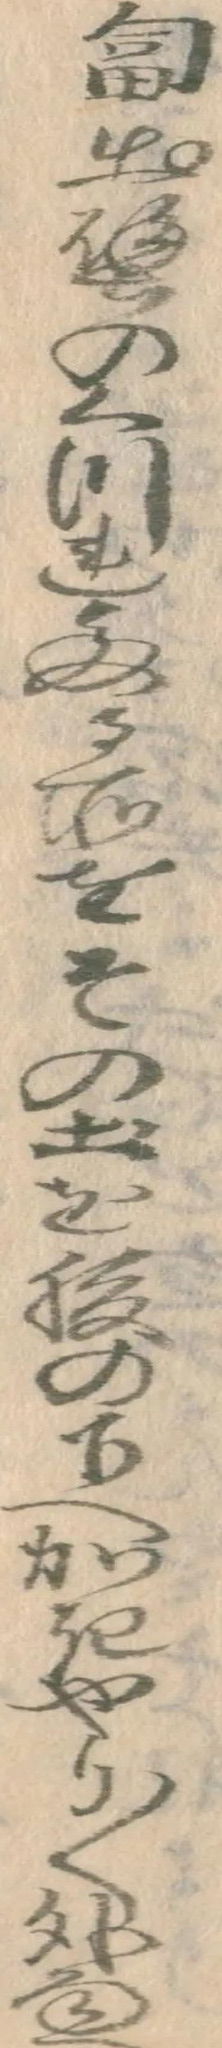匍出壁のくつれたる所をその土を腹の下へかきやり〳〵外面へ
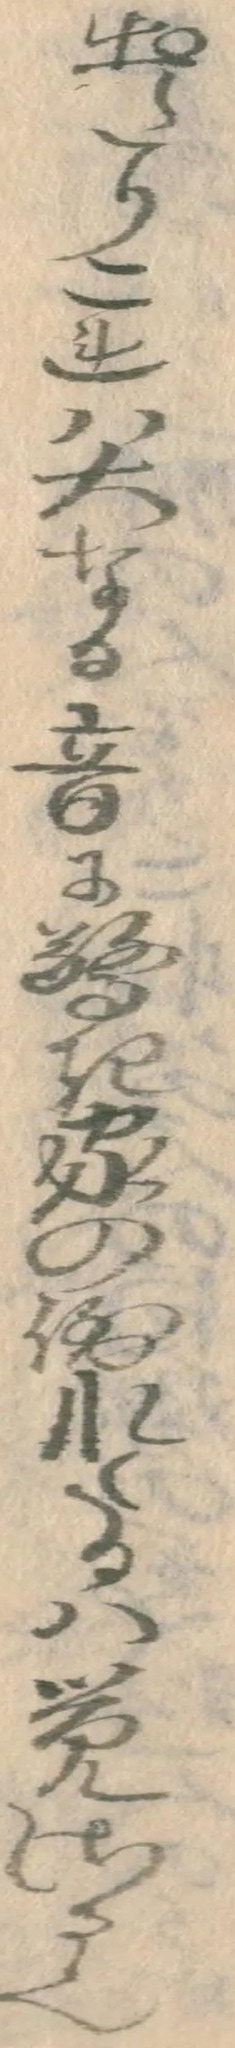出たりこれハ大なる音に驚き家の倒れたるハ覚つる也
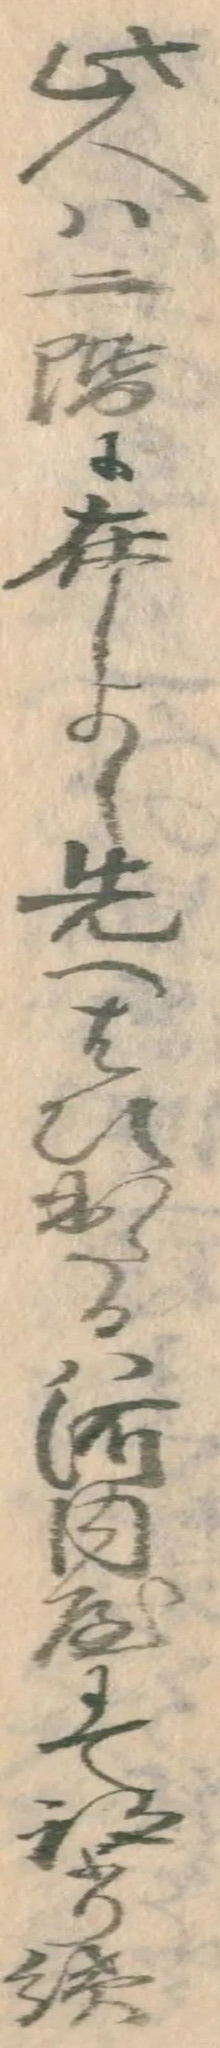此人は二階に在しよし先へはひ出たるハ河内屋にて跡より続
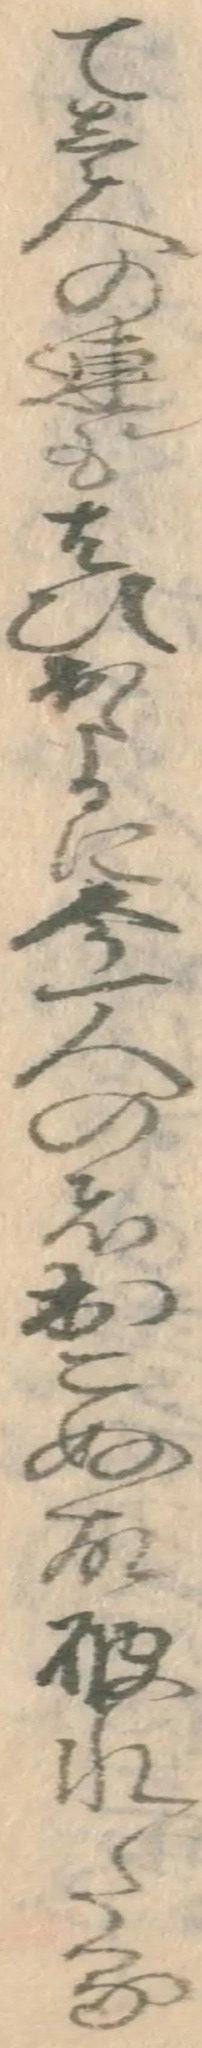て壱人の連レもはひ出たるに今一人の者出こぬ故破れた家

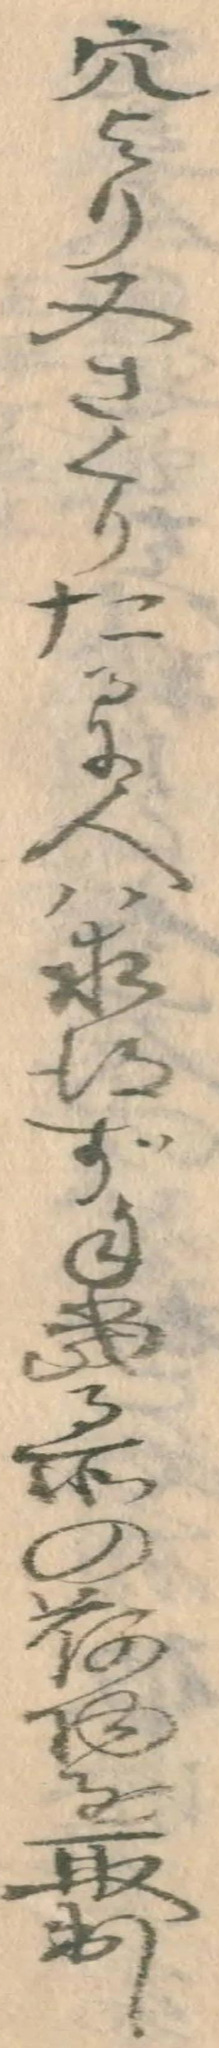穴より又さくりたるに人ハ求得ず当る所の荷物を取出し
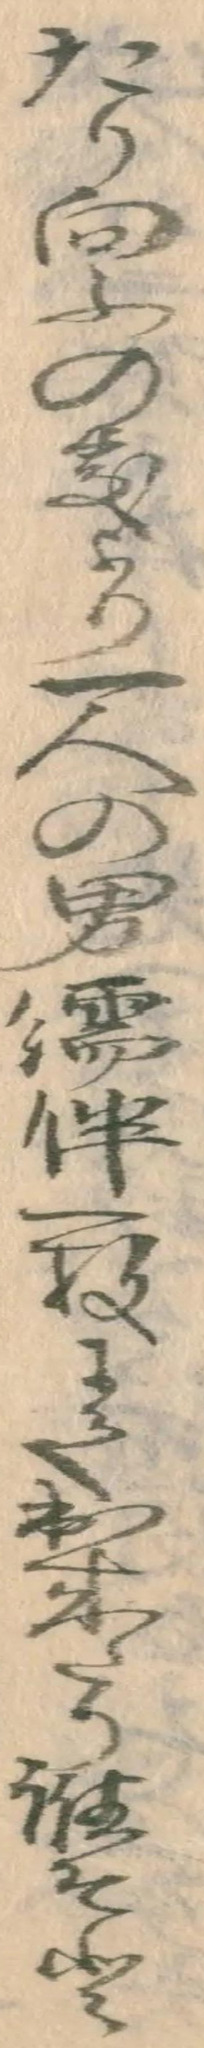たり向ふの処より一人の男襦袢一枚にて出来たり誰そと
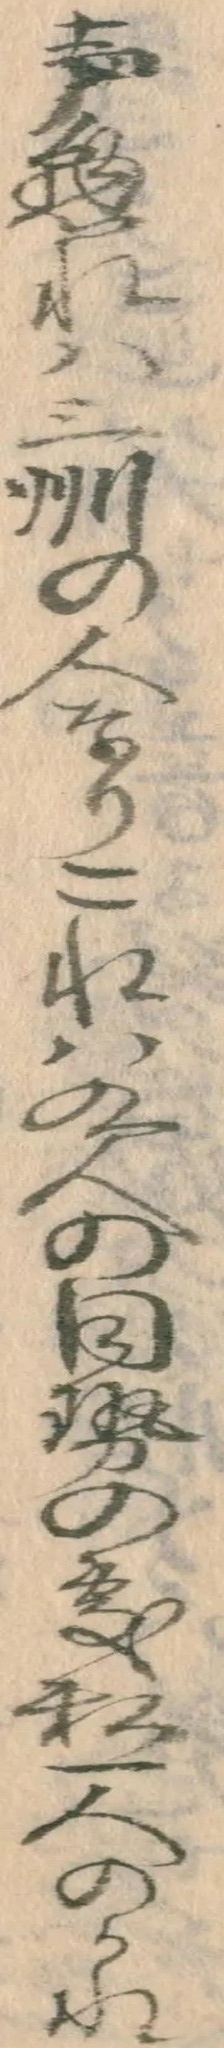声懸れハ三州の人なりこれハ九人の同勢の処私一人のかれ
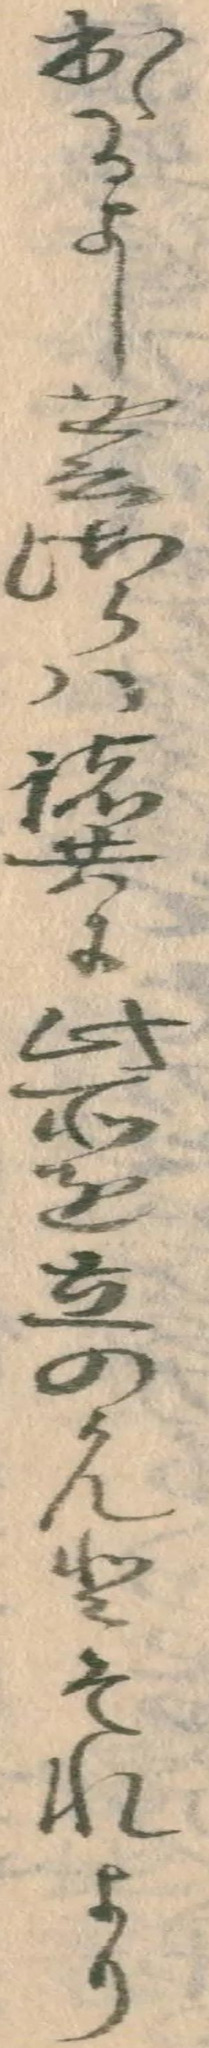出たるよしを云みらハ諸共此所を立のかんとそれより
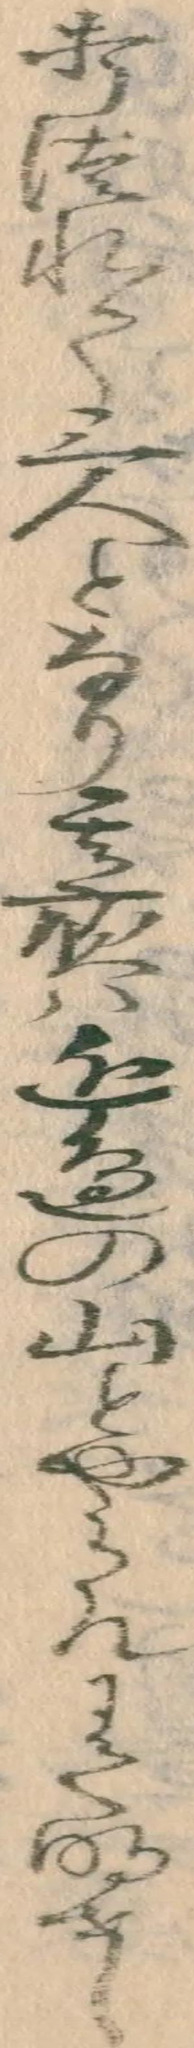打つれて三人となり其夜ハ近辺の山とやらんにて明せし
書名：信州大地震之記
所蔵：国立国会図書館 National Diet Library, JAPAN
